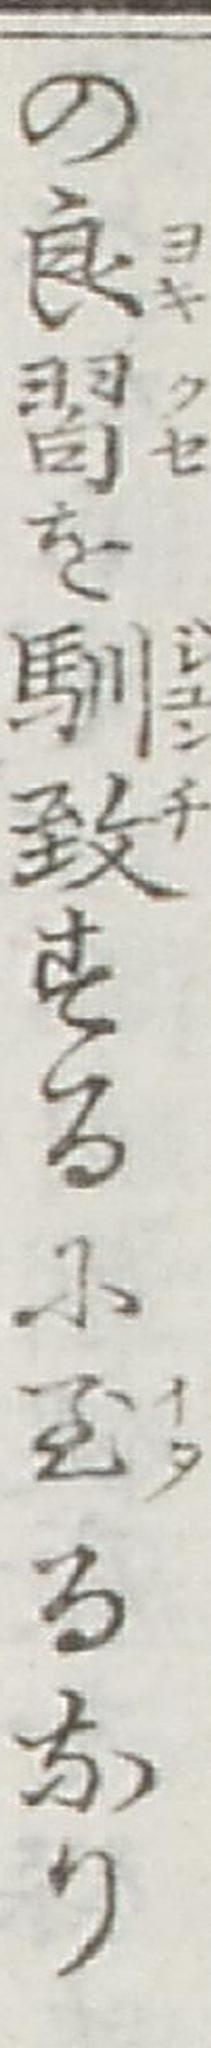の良習を馴致するに至るなり
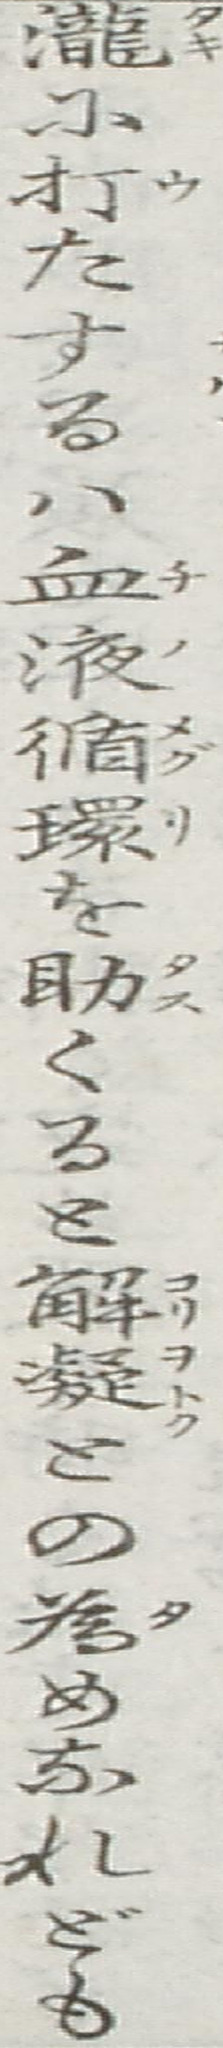瀧に打たするは血液循環を助くるとの解凝との為めなれども
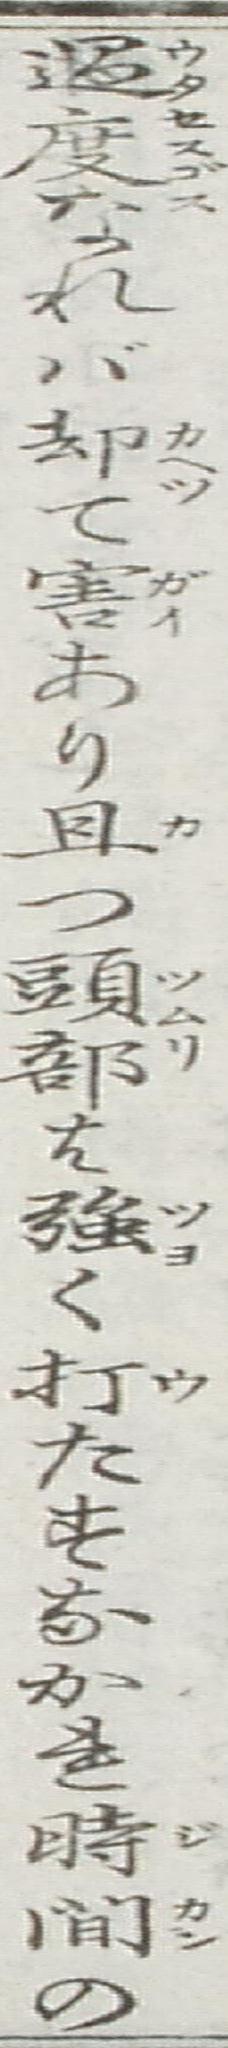過度なれば却て害あり且つ頭部は強く打たすなかけ時間の
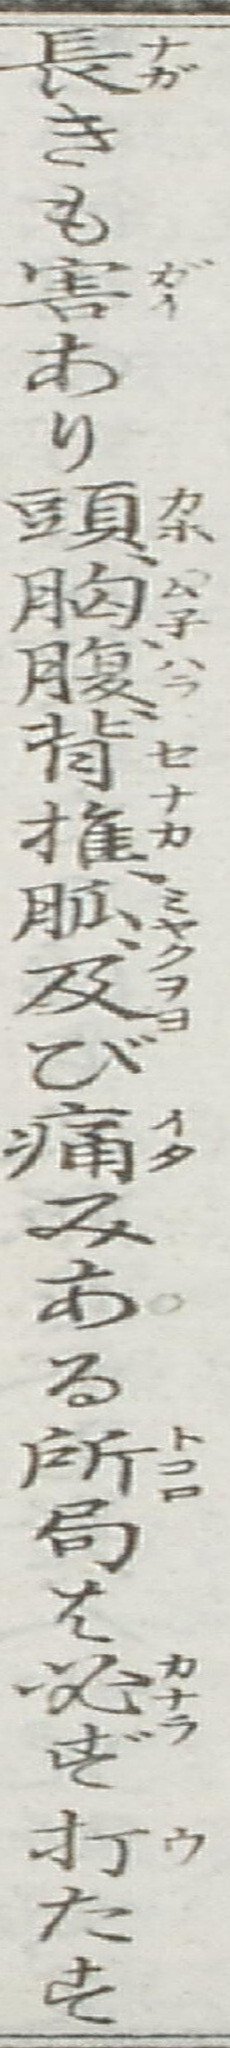長きも害あり頭、胸、腹、背椎、脈、及び痛みある所局は必ず打たす
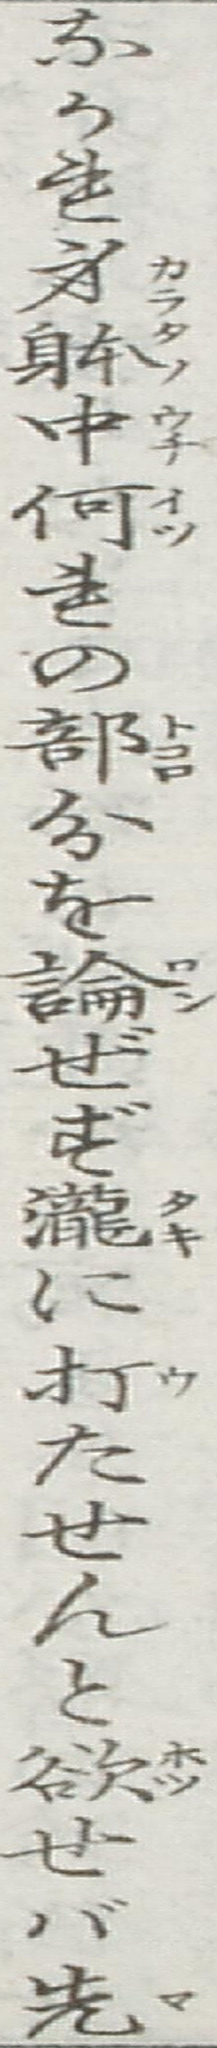なかけ爲躰中何けの部分を論ぜず瀧に打たせんと欲せば先
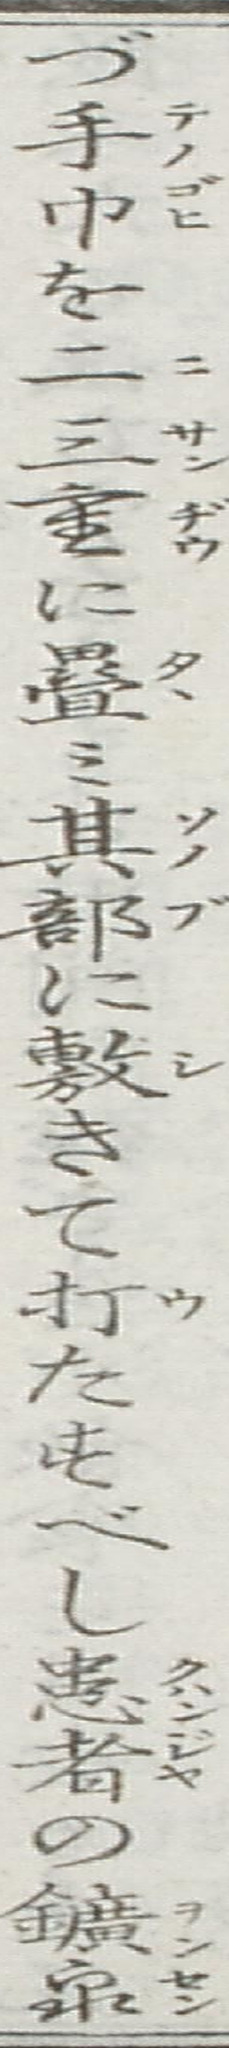づ手巾を二三重に疂み其部に敷きて打たすべし患者の鉱泉
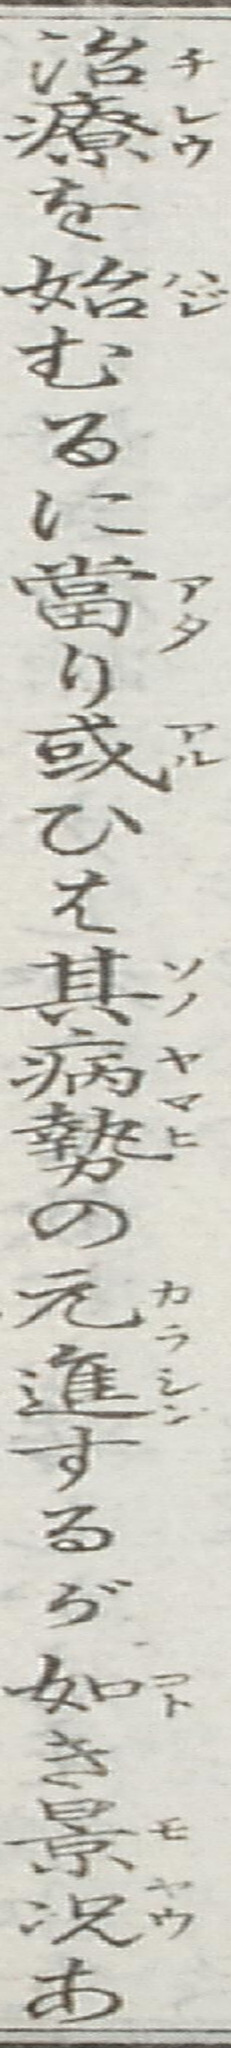治療を始むるに当り或ひは其病勢の元進するが如き景況あ
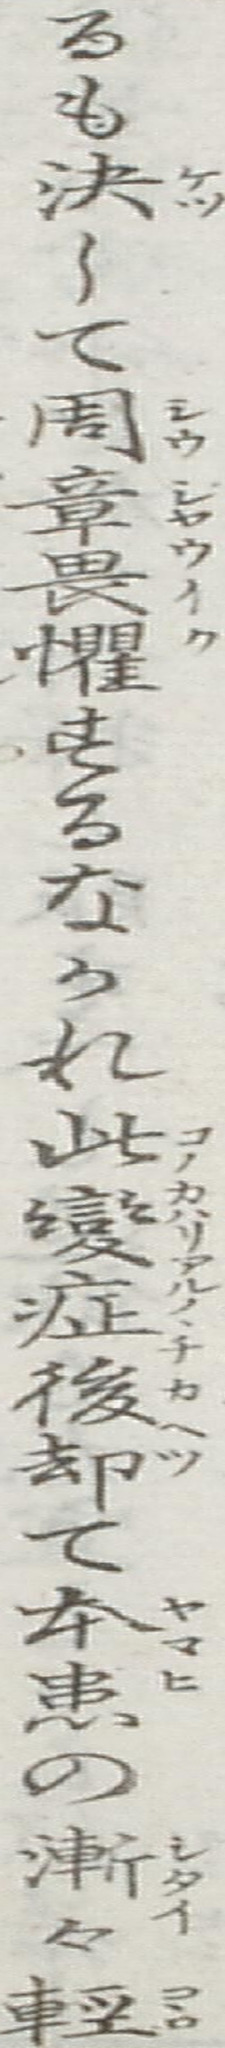るも決して周章畏懼するなかれ此変症後却て本患の漸々軽
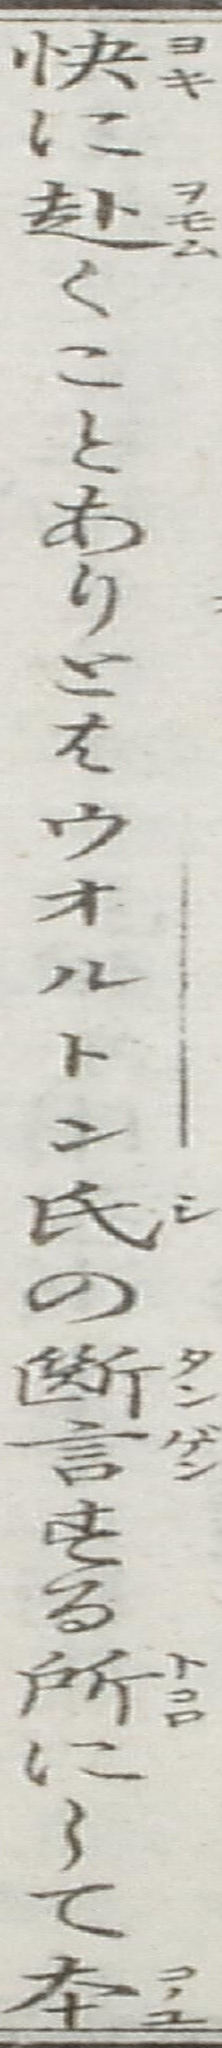快に赴くことありとはウオルトン氏の断言する所にして本
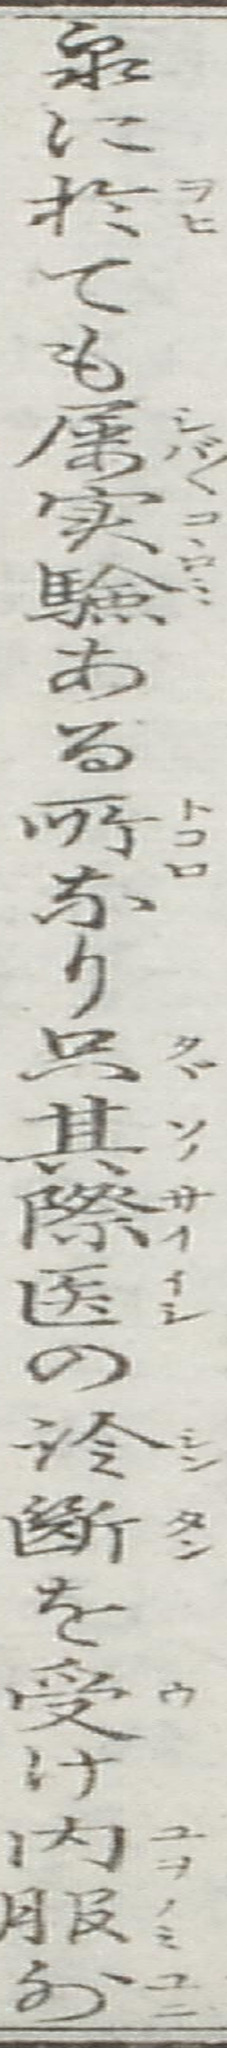泉に於ても屡実験ある所なり只其際医の診断を受け内服分
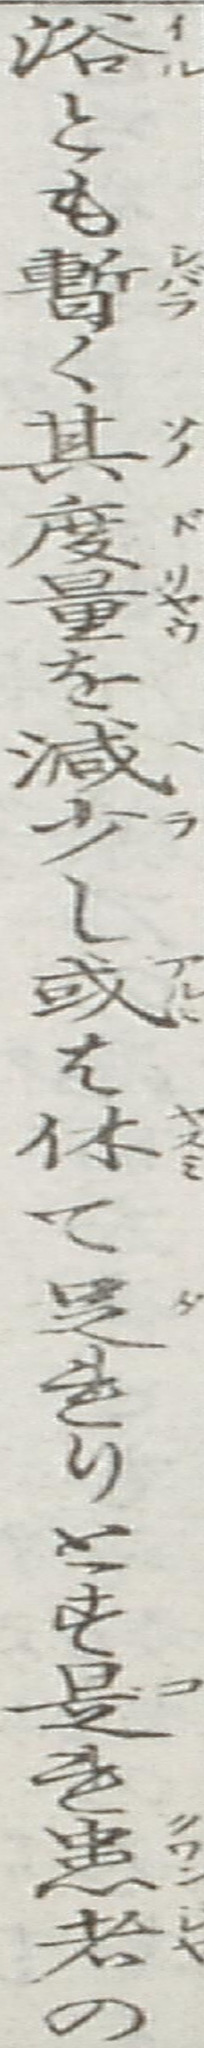浴とも暫く其度量を減少し或は休て足れりとす是れ患者の
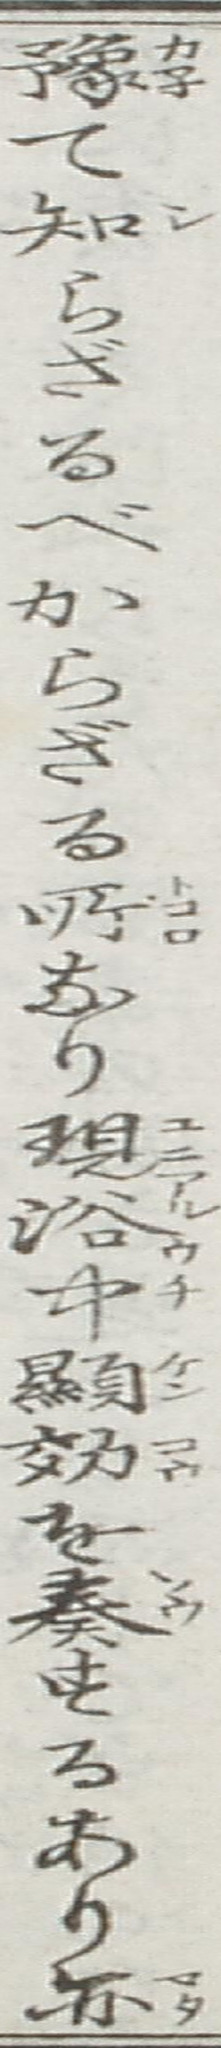豫て知らざるべからざる所なり現浴中顕効を奏するあり亦
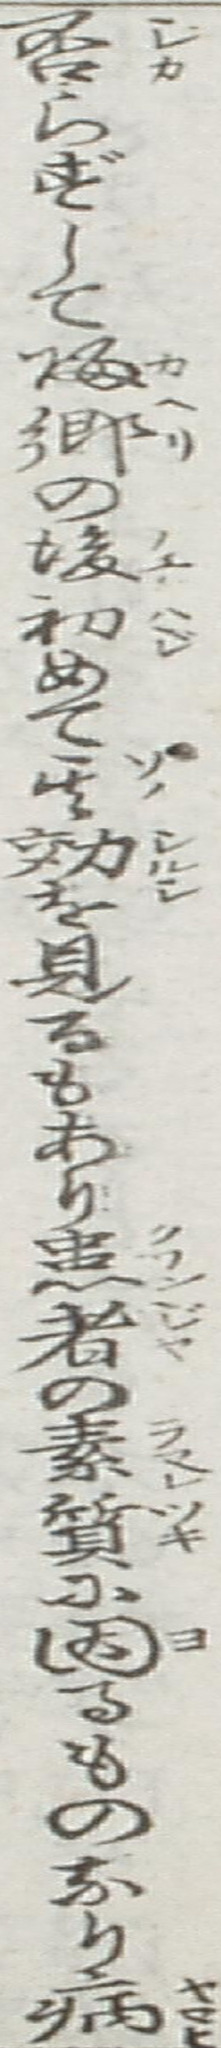否らずして帰郷の後初めて其効を見るもあり患者の素質に因るものなり病
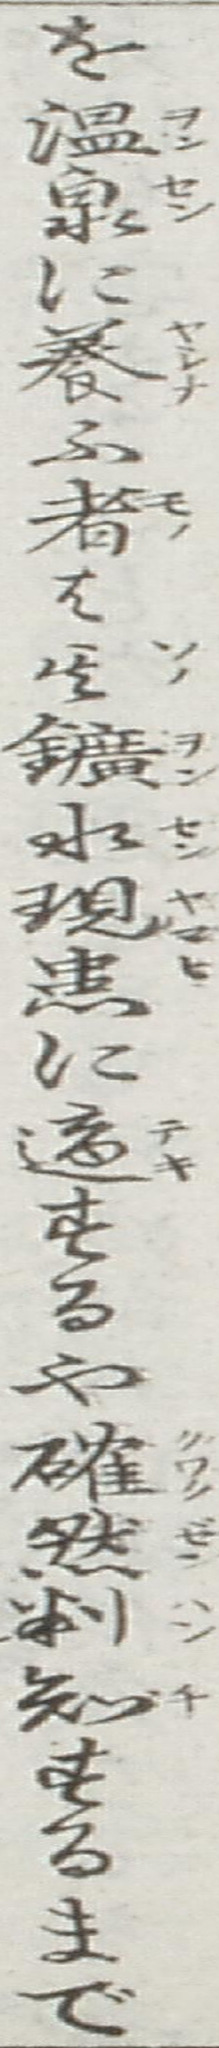を温泉に養ふ者は其鉱水現患に適？するや確然判知するまで
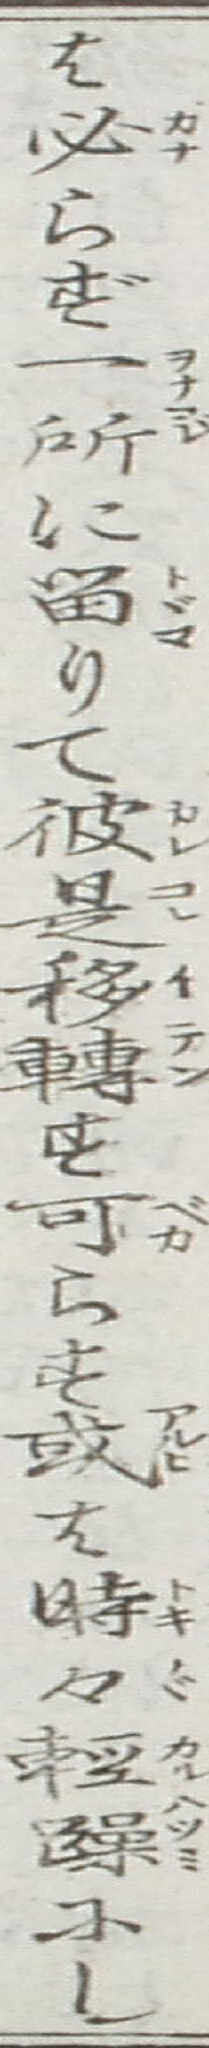は必らず一所に留りて彼是移転す可らす或は時々軽躁にし
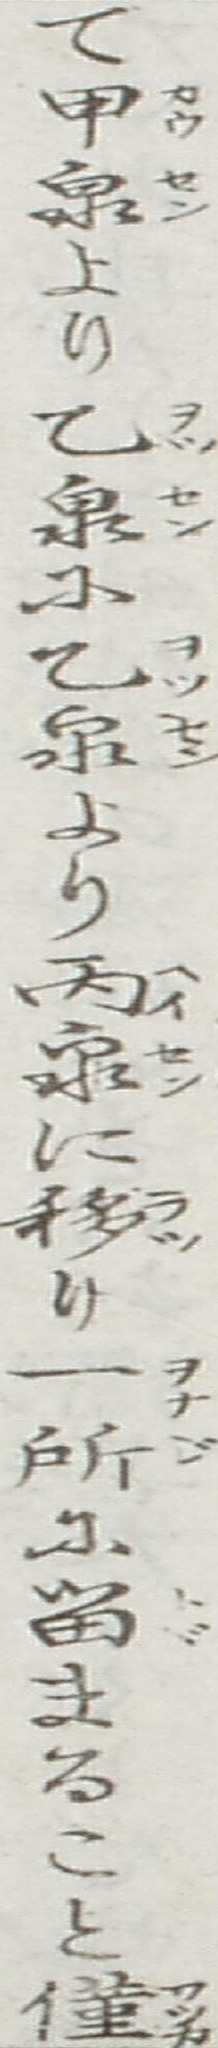て甲泉より乙泉に乙泉より丙泉に移り一所に留まること僅
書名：草津温泉誌　全
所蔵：東京大学地震研究所図書室 Earthquake Research Institute Library, The University of Tokyo, JAPAN
